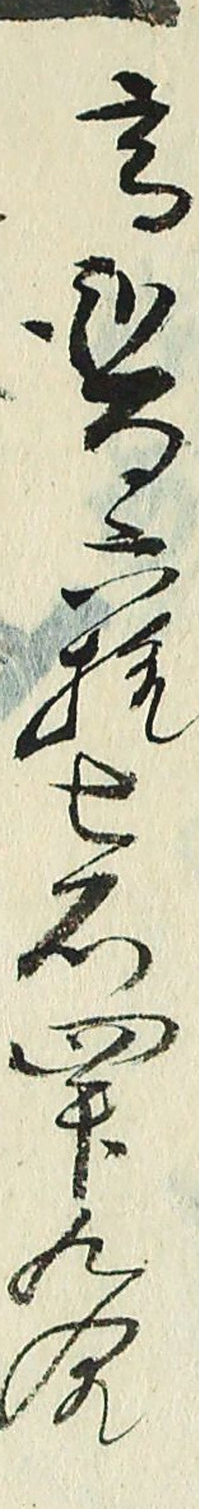高弐百六拾七石四升九合
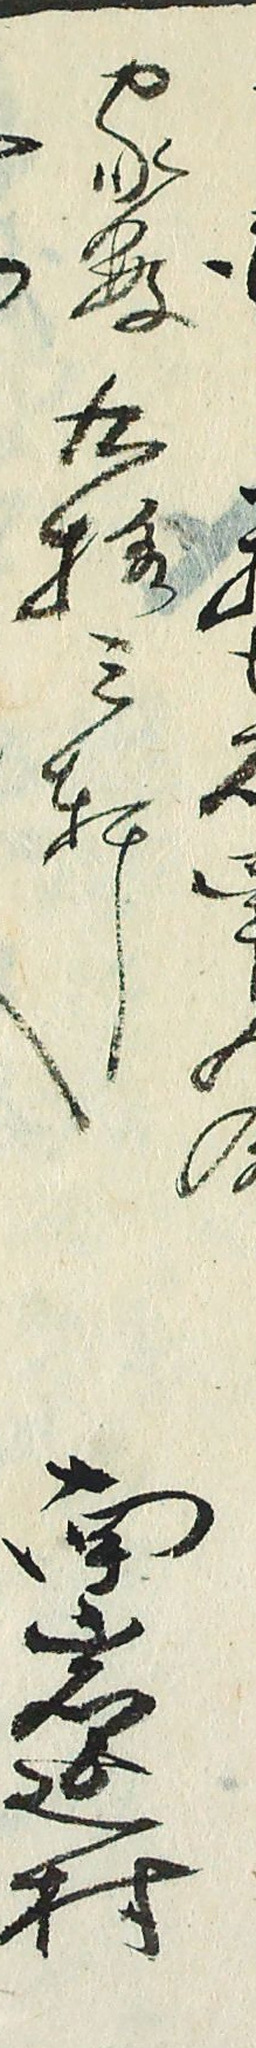家数九拾三軒南岩延村
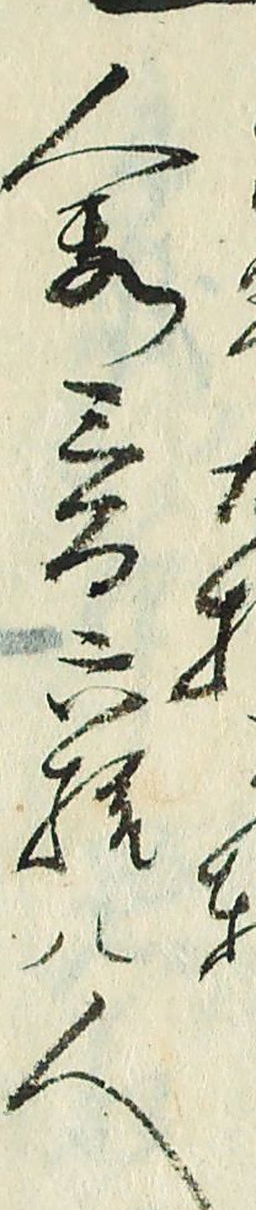人数三百六拾八人
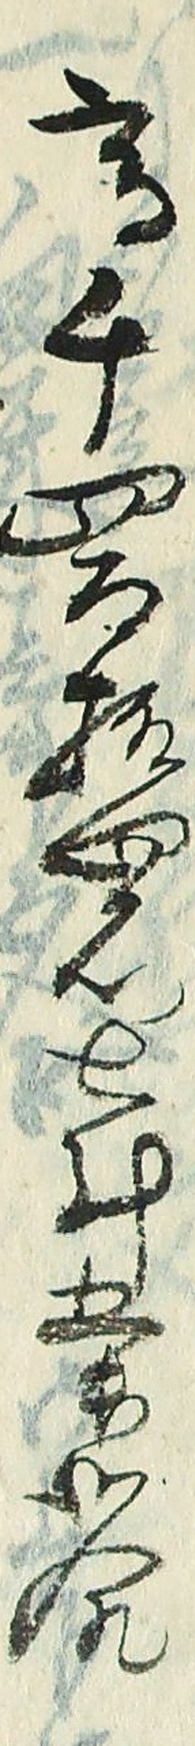高千四百拾四石七斗五升弐合
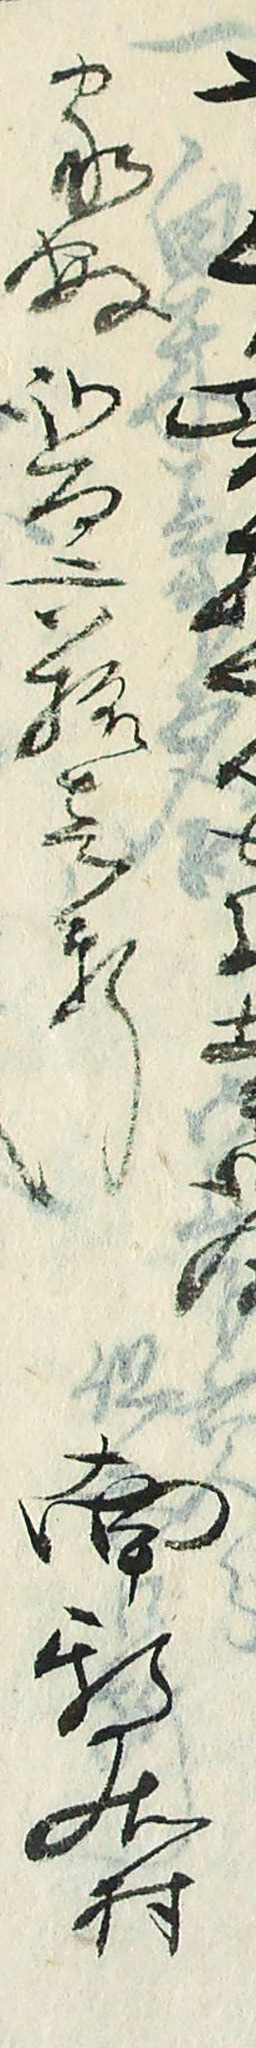家数弐百六拾壱軒南新居村
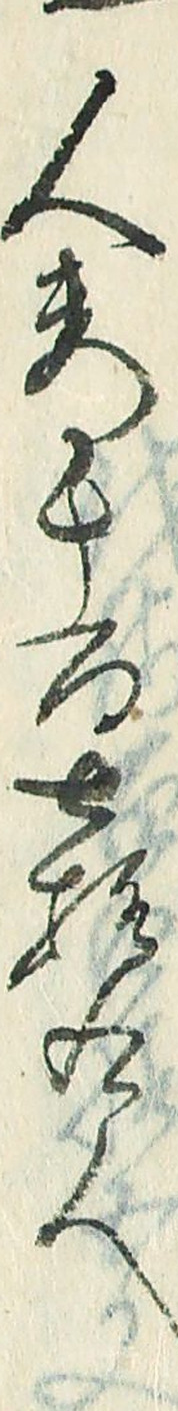人数千百七拾九人

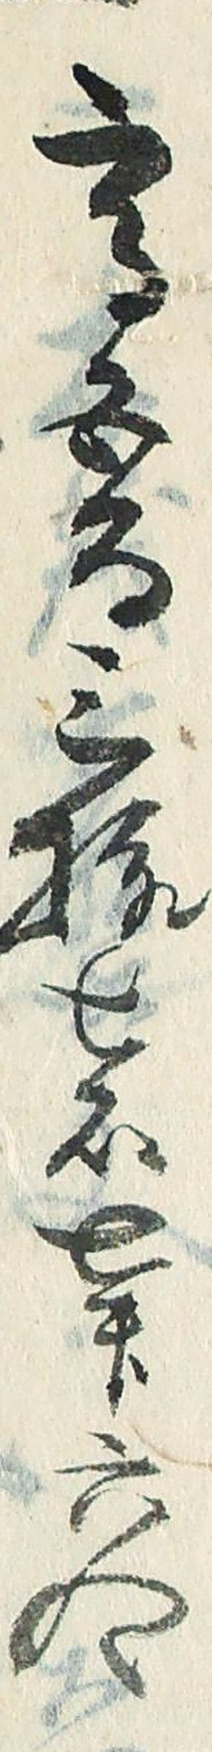高五百三拾七石七升六合
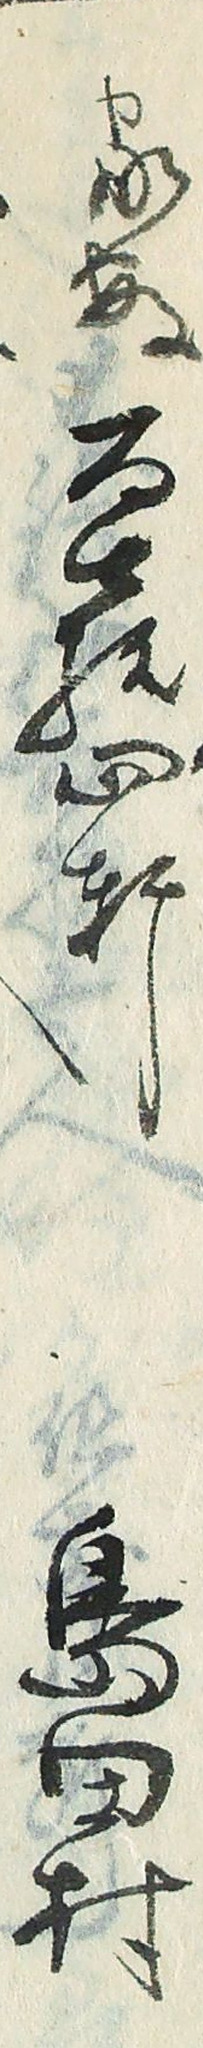家数百七拾四軒島田村
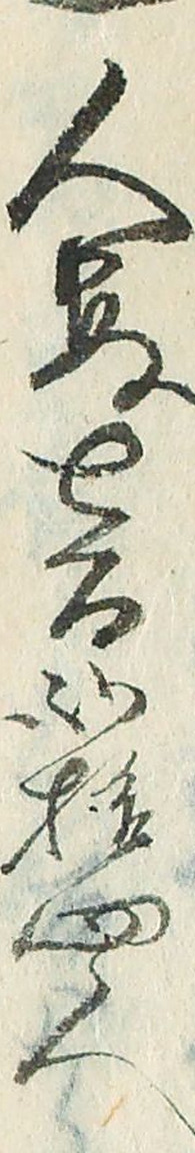人数七百弐拾四人
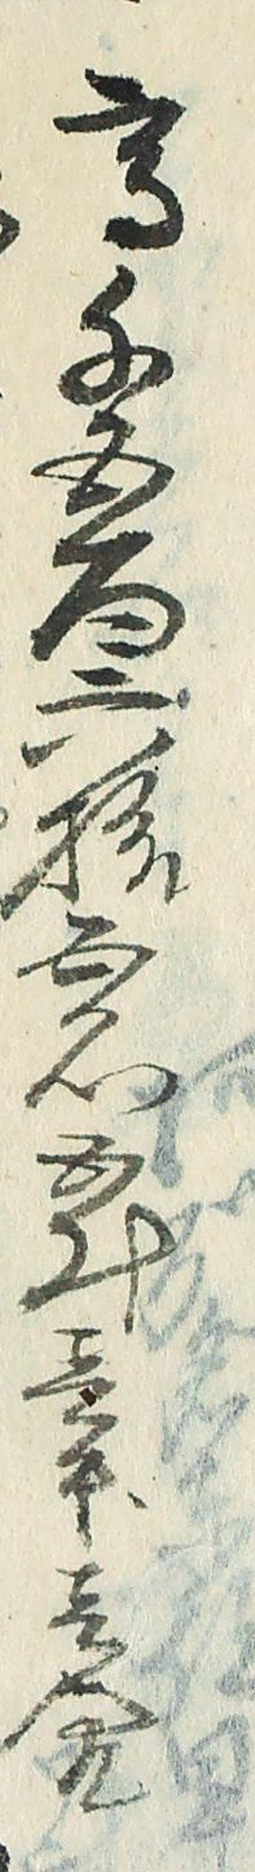高千五百六拾五石五斗壱升壱合
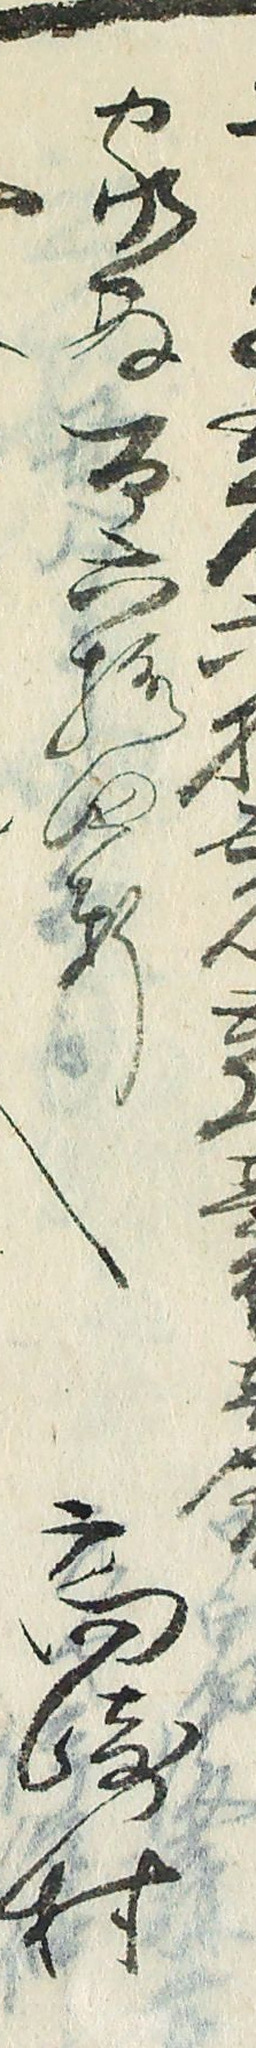家数百六拾四軒高崎村
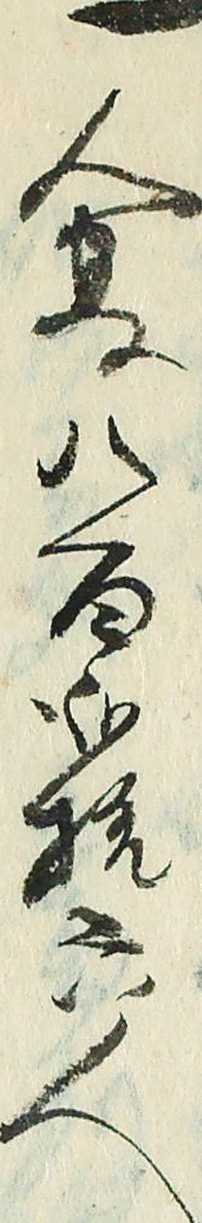人数八百弐拾六人
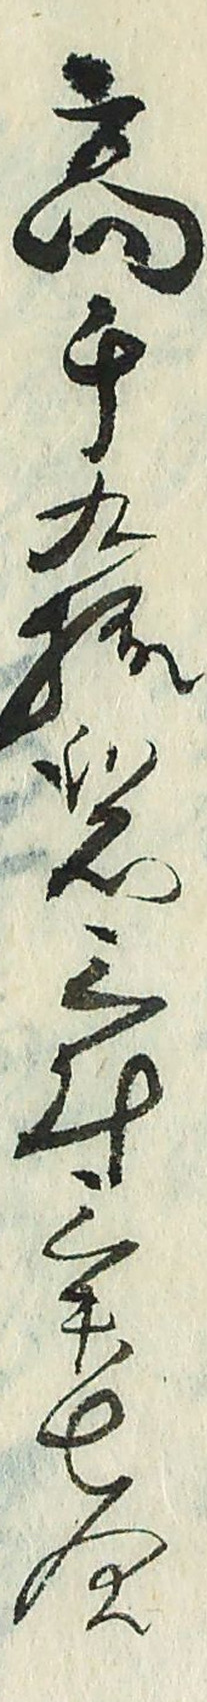高千九拾弐石三斗三升七合
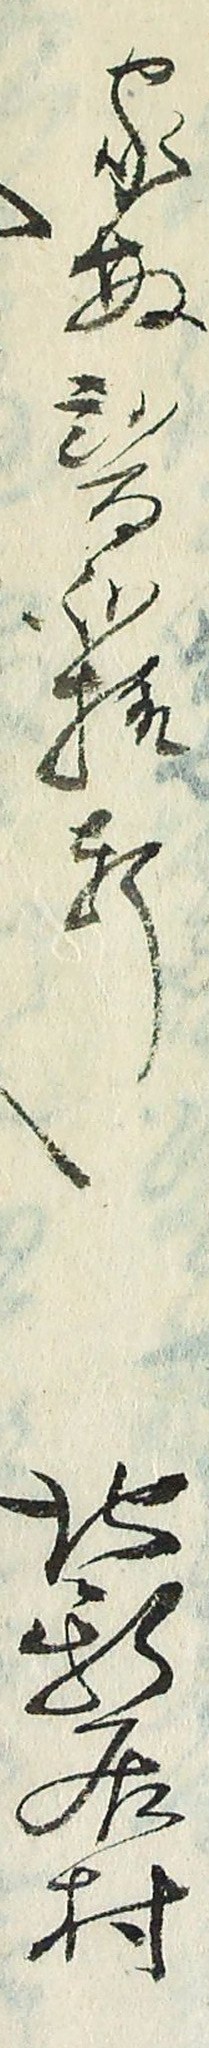家数弐百弐拾軒北新居村
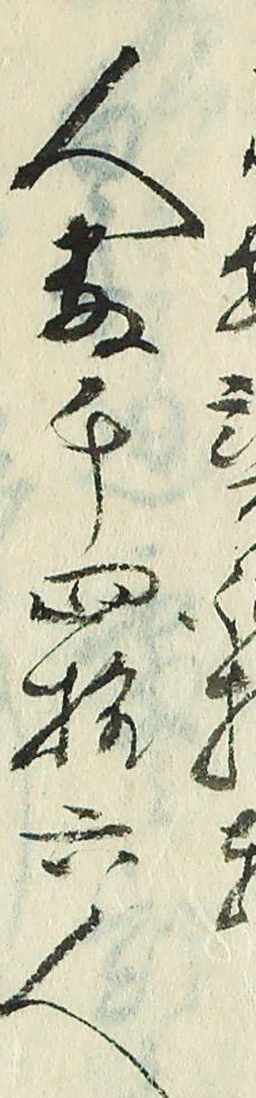人数千四拾六人
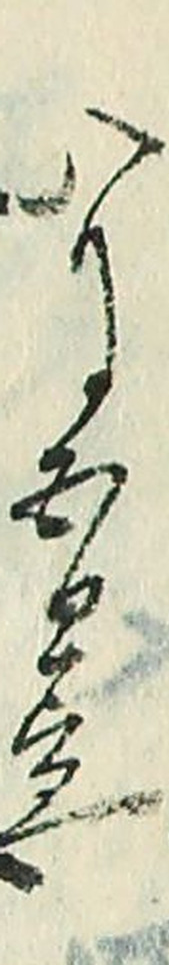八月五日昼
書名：公辺御役人為御廻浦御立越諸御用一巻
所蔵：鳴門教育大学 Naruto University of Education
